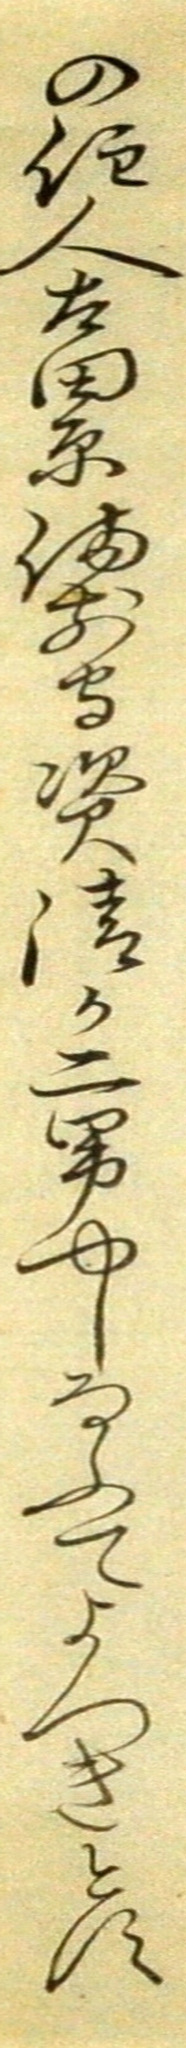の住人太田原備前守資清か二男やしなふてよつきとす
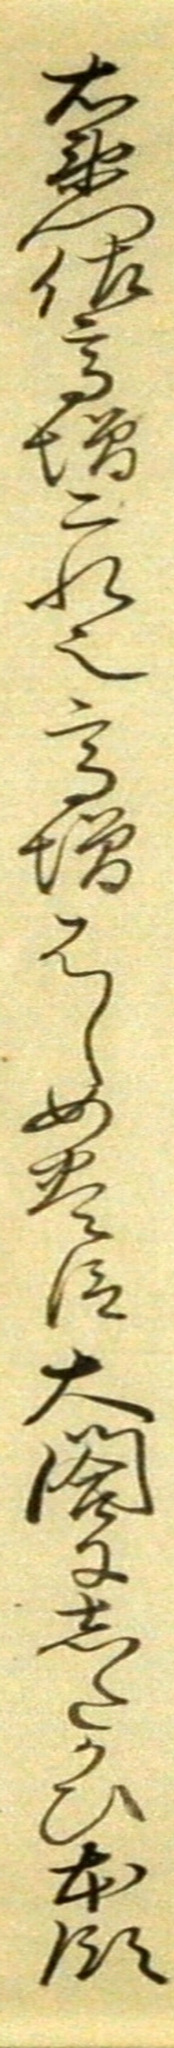右衛門佐高増これ也高増はしめ豊臣太閤にしたかひ本領
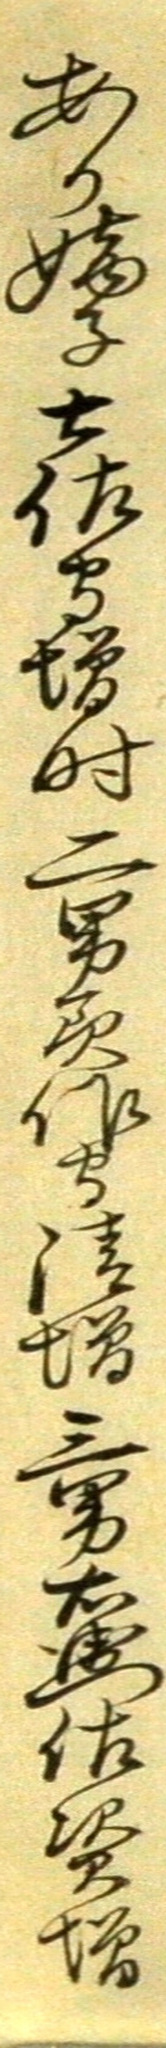あり嫡子土佐守増時二男美作守清増三男右衛門佐資増

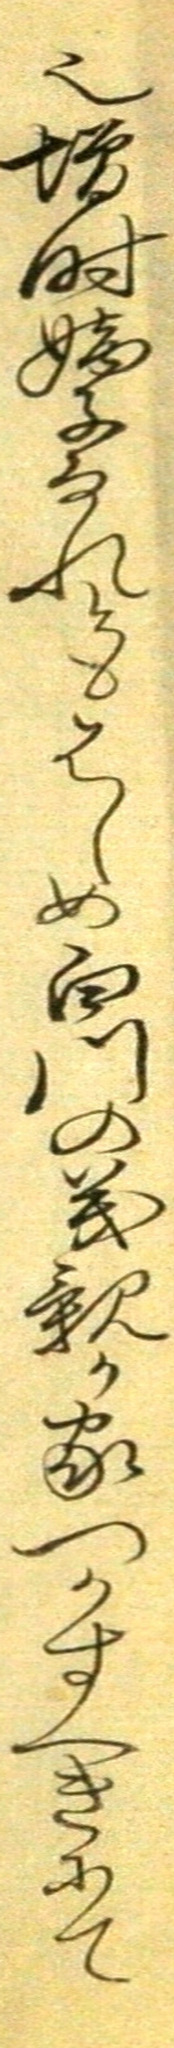也増時嫡子なれともはしめ白川の義親か家つかすへきにて
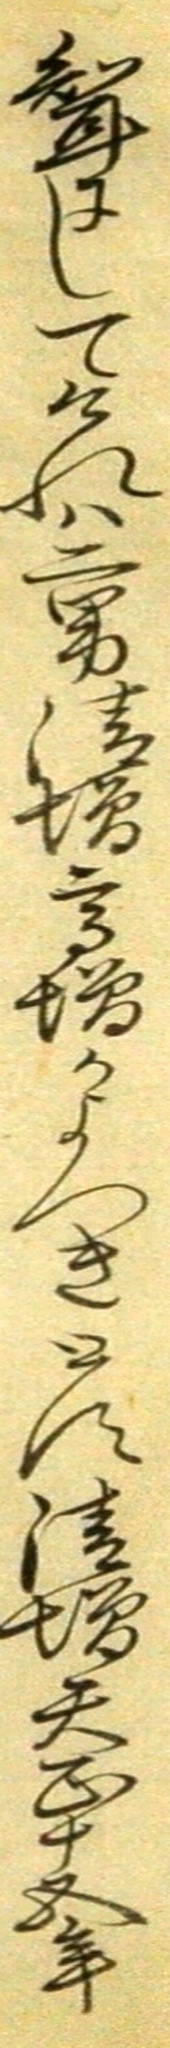聟にしてけれは二男清増高増かよつきとす清増天正十五年
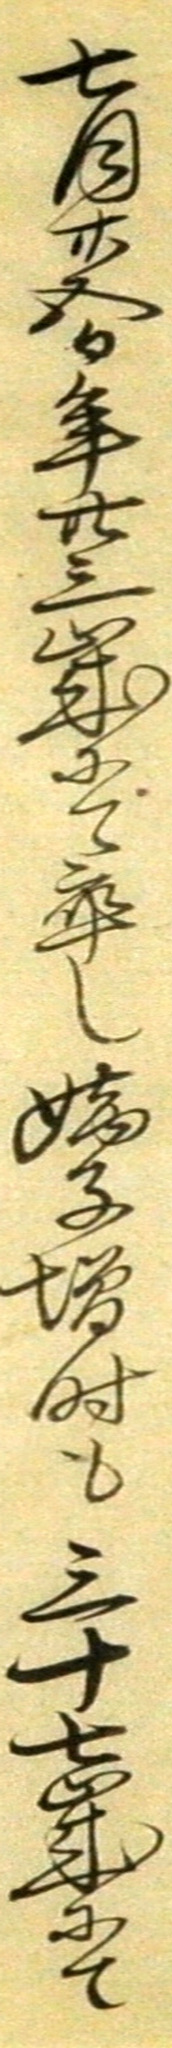七月廿五日年廿三歳にて卒し嫡子増時も三十七歳にて
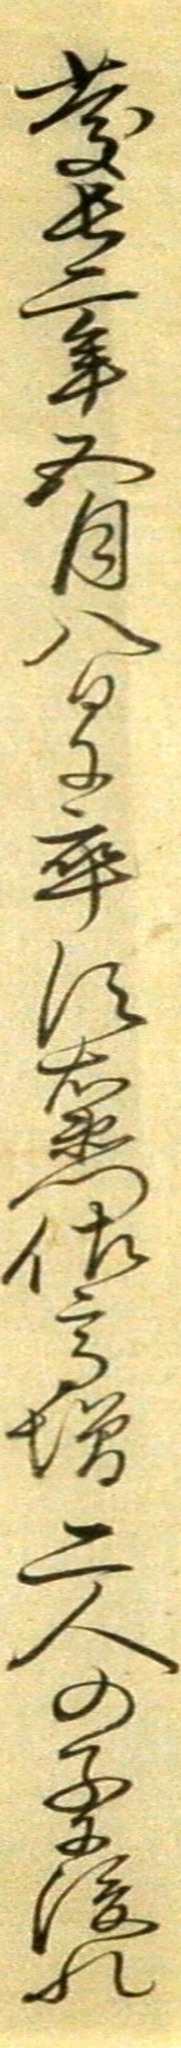慶長二年五月八日に卒す右衛門佐高増二人の子に後れ
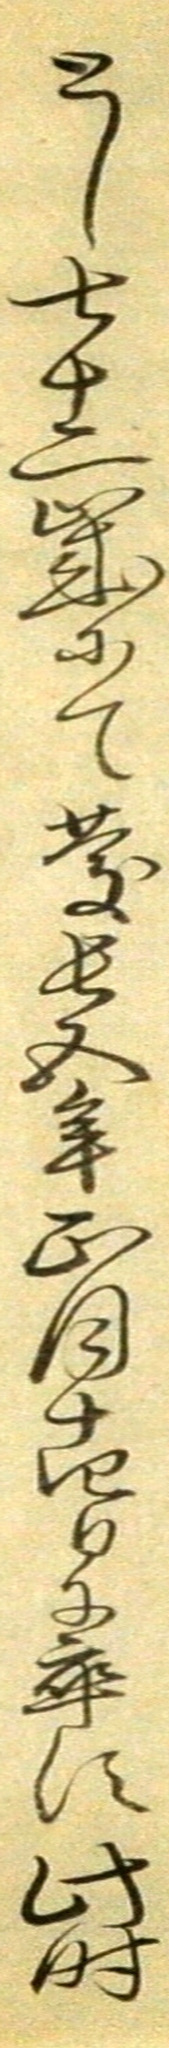とし七十二歳にて慶長五年正月十四日に卒す此時
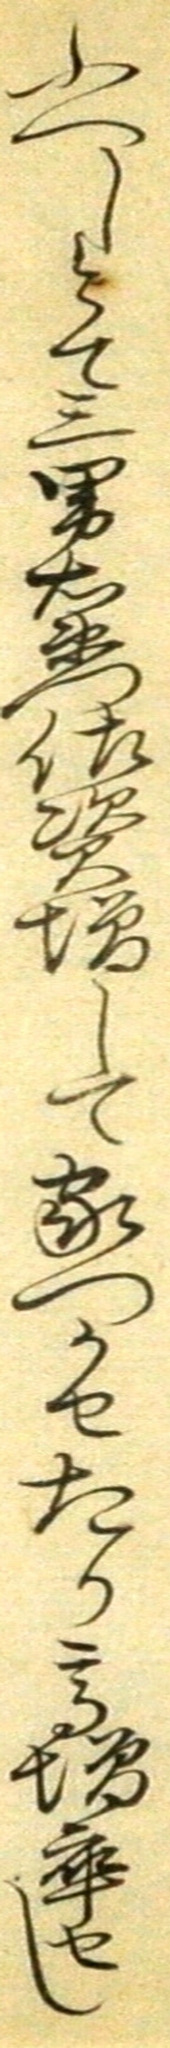ふへしとて三男右衛門佐資増して家つかせたり高増卒せし
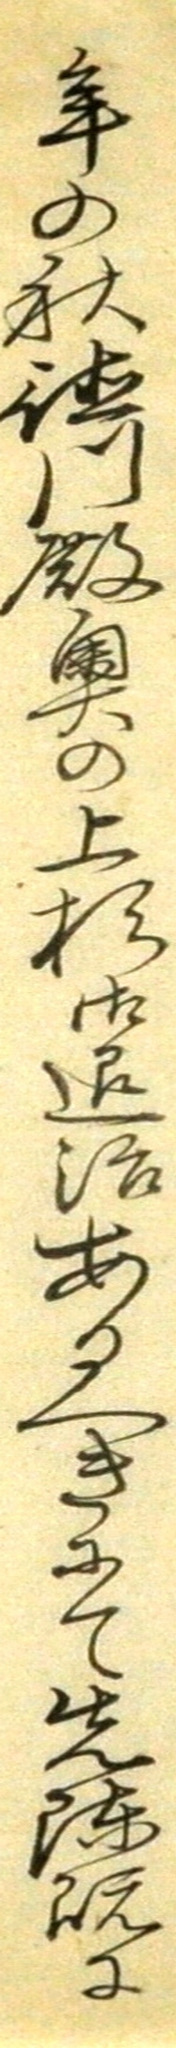年の秋徳川殿奥の上杉御退治あるへきにて先陣既に
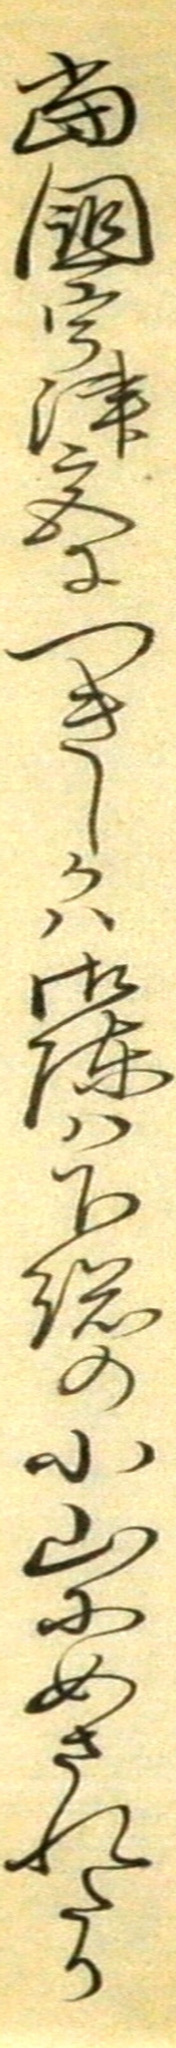当国宇津宮につきしかは御陣は下総の小山にめされたり
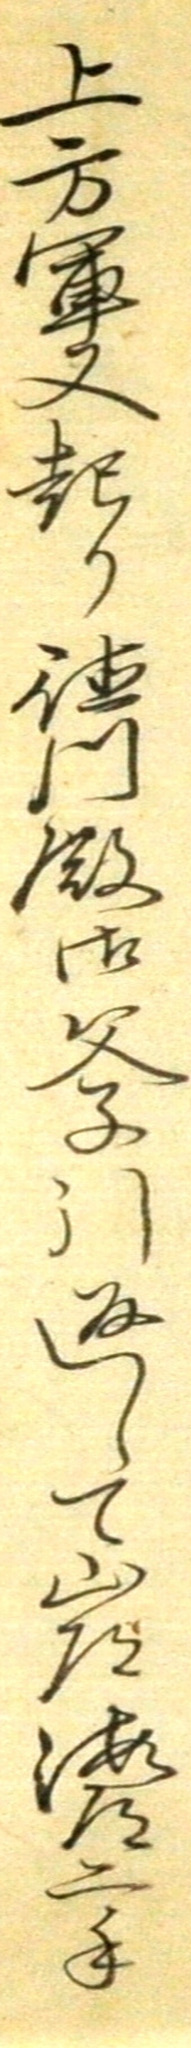上方軍又起り徳川殿御父子引返して山道海道二手
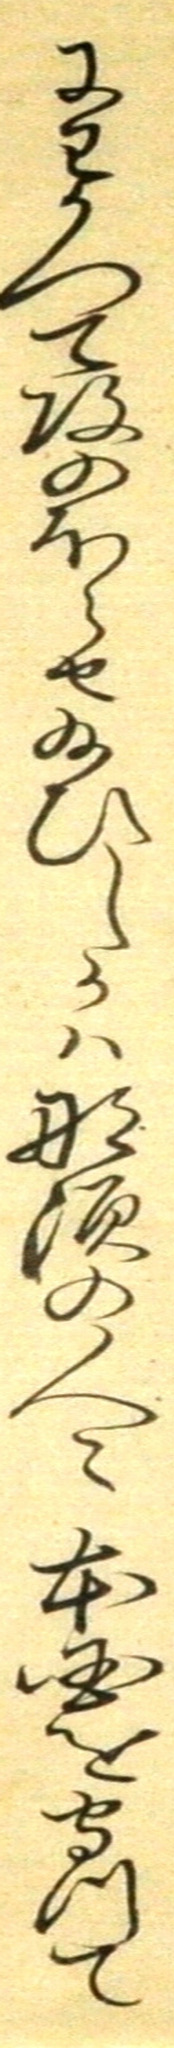にわかつて攻のほらせ給ひしかは那須の人々本国を守つて
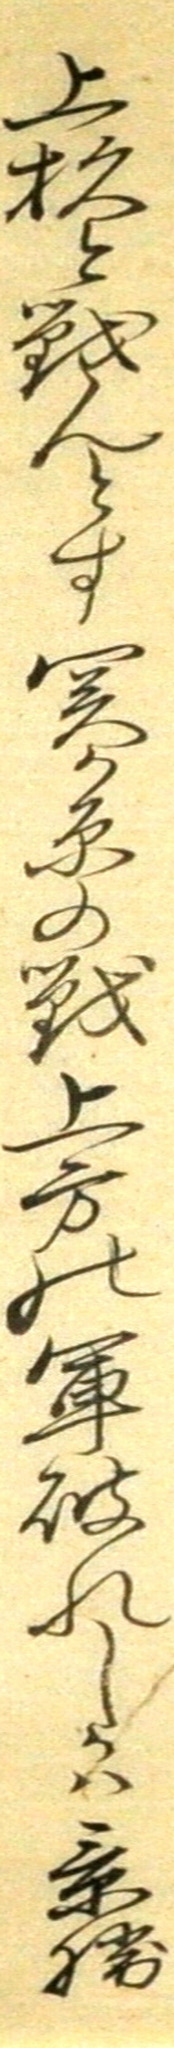上杉と戦んとす関か原の戦上方の軍破れしかは景勝
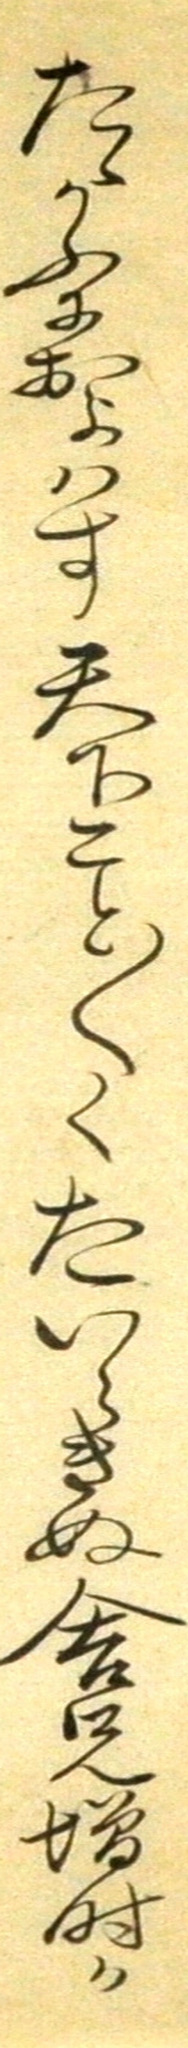たゝかふにおよはす天下こと〳〵くたいらきぬ舎兄増時か
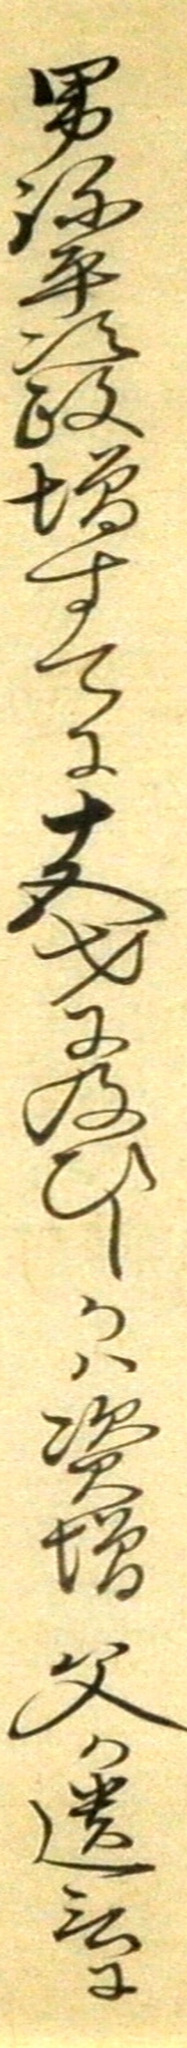男弥平次政増すてに十五才に及ひしかは資増父か遺言に
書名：藩翰譜（九・下）
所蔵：伊那市立高遠町図書館・合同会社AMANE
